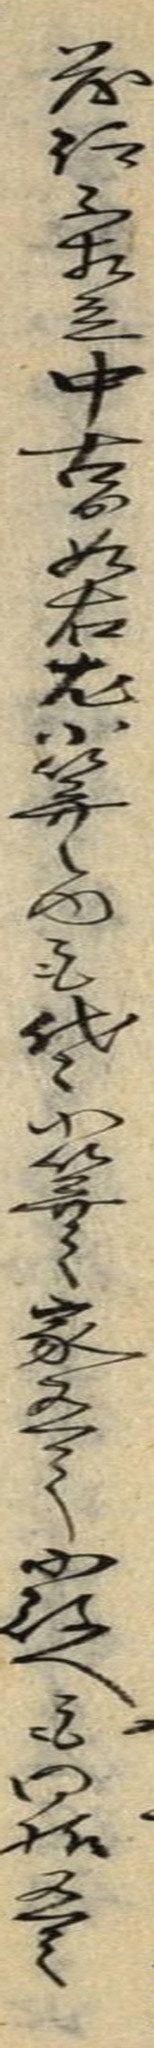も跡不相立中古ゟ如右尤小算之内にも代々小算之家有之小役人にも同様有之
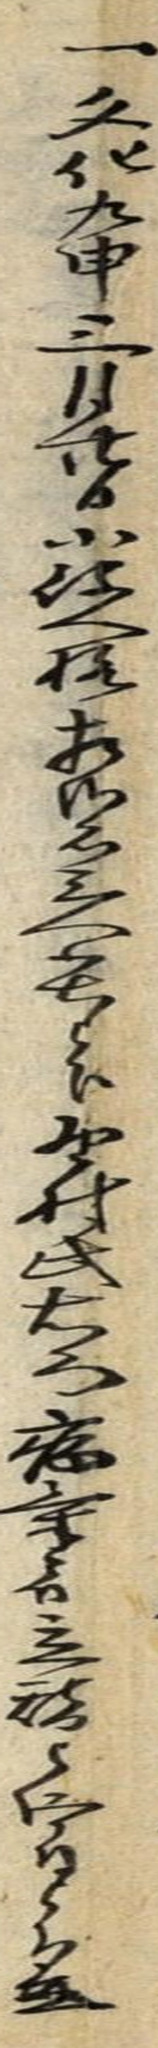一文化九申三月廿日小役人格拾弐石三人ふち被下野村民右衛門病気に付立替被仰付被下置
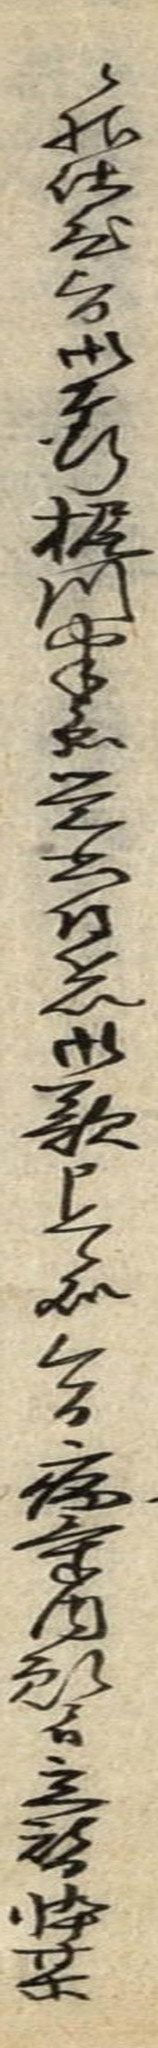候様仕度旨御奉行梶川半兵衛覚書付を以御歎申上候処今日病気内願に付立替忰某
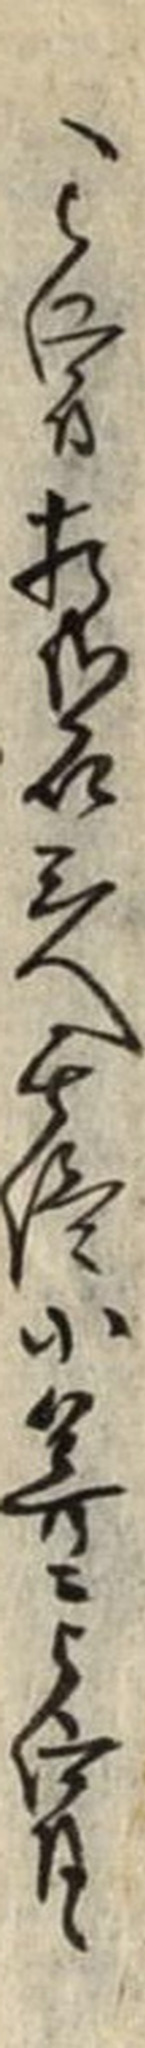へ被仰付拾弐石三人其侭小算に被仰付候
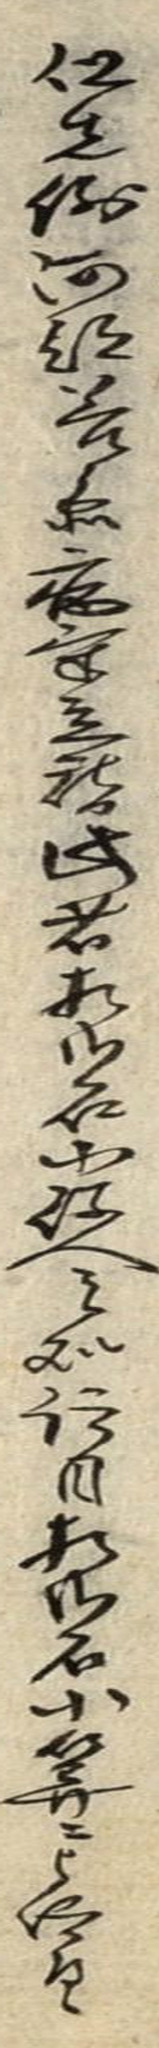但先例河部善兵衛病気立替此者拾弐石小役人に候処跡目拾弐石小算に被仰付候
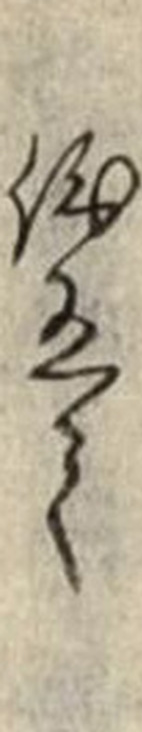例有之
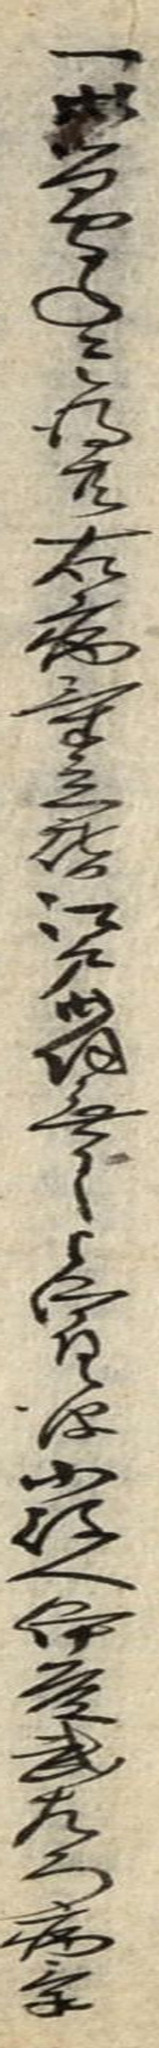一御留守年に候得共右病気立替江戸御伺無之被仰付候儀小役人伊藤武左衛門病気
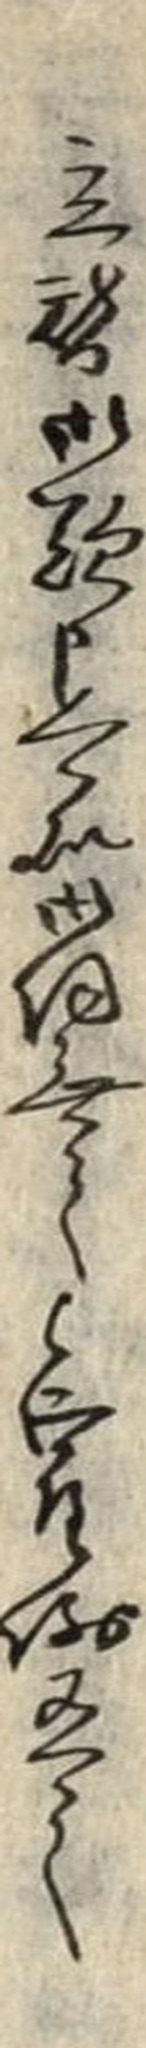立替御歎申上候処御伺無之被仰付候例有之
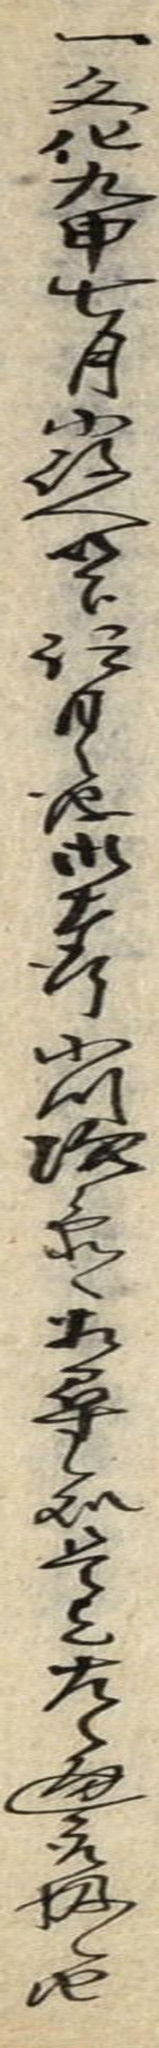一文化九申七月小役人以下跡目之儀御奉行小川次兵衛へ相尋候処是迄左之通取扱候由
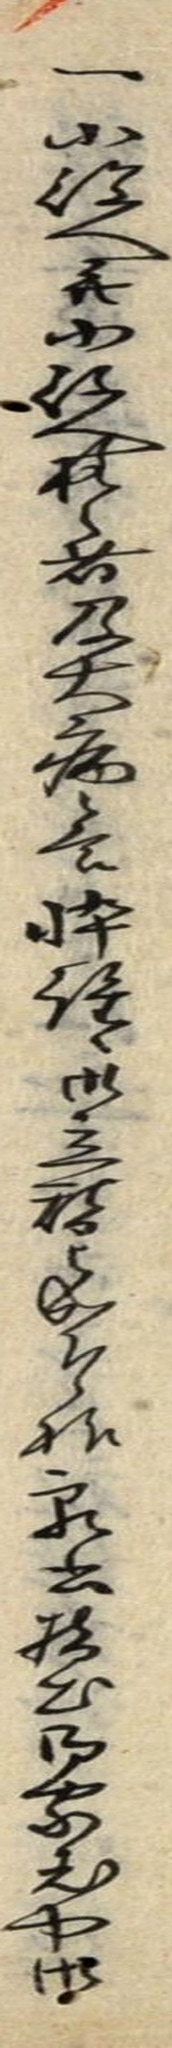一小役人并小役人格之者及大病候節忰誰へ御立替被成下候様願書指出御家老中御

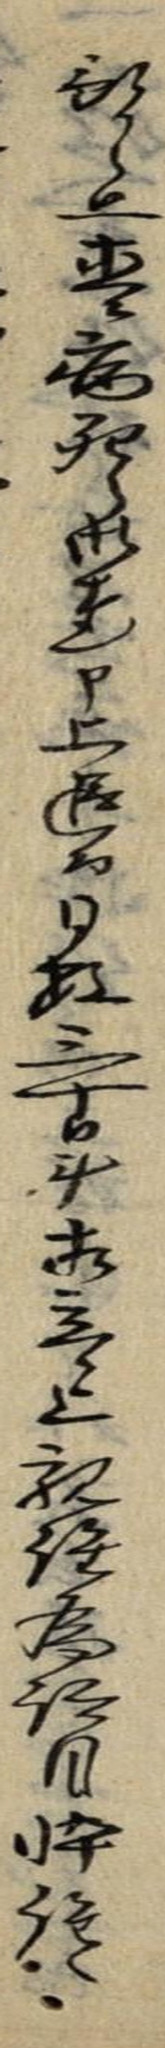預り候上直に病死之御達申上追而日数三十日斗相立候上親誰為跡目忰誰へ
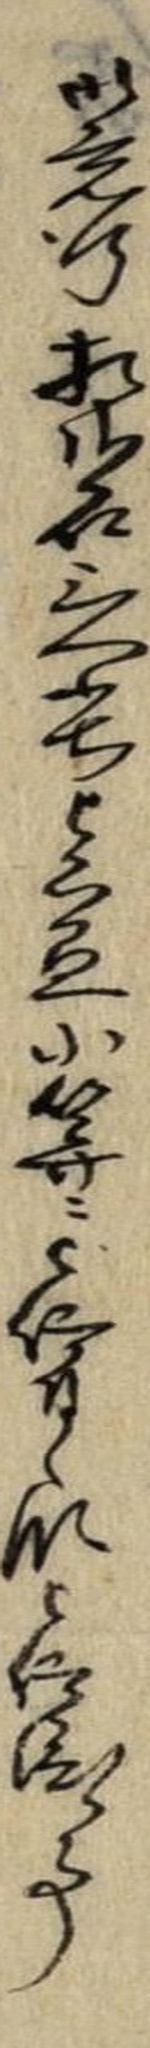御充行拾弐石三人ふち被下置小算に被仰付候段被仰渡候事
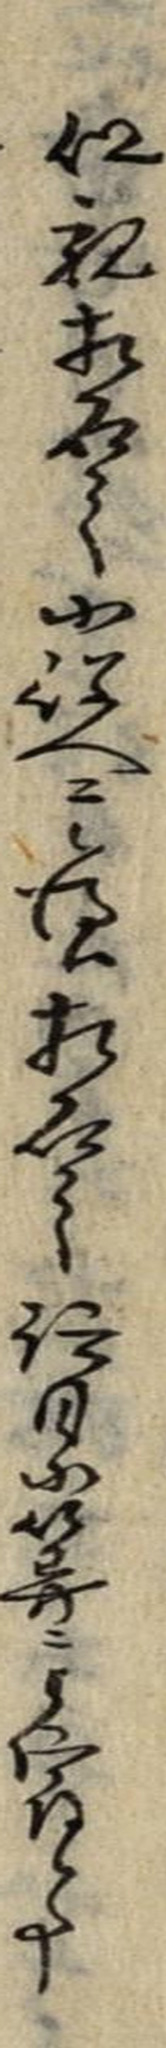但親拾石之小役人に候得は拾石之跡目小算に被仰付候事
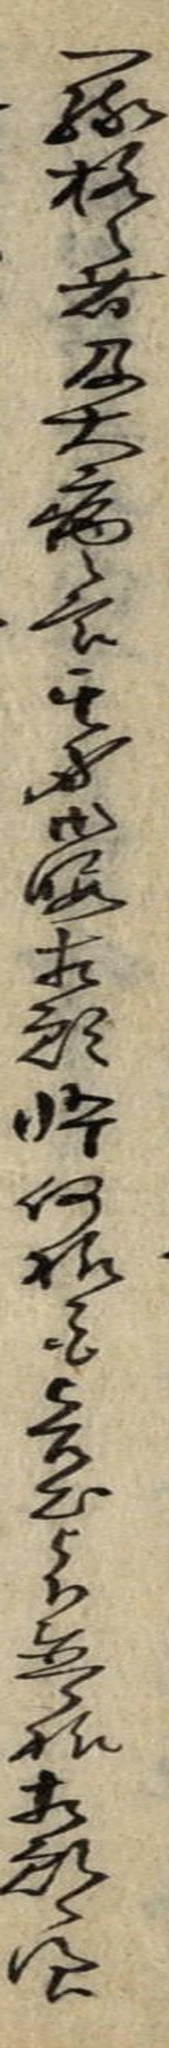一一統格之者及大病候節其身御暇相願忰何様にも被召出被下置候様相願候得は
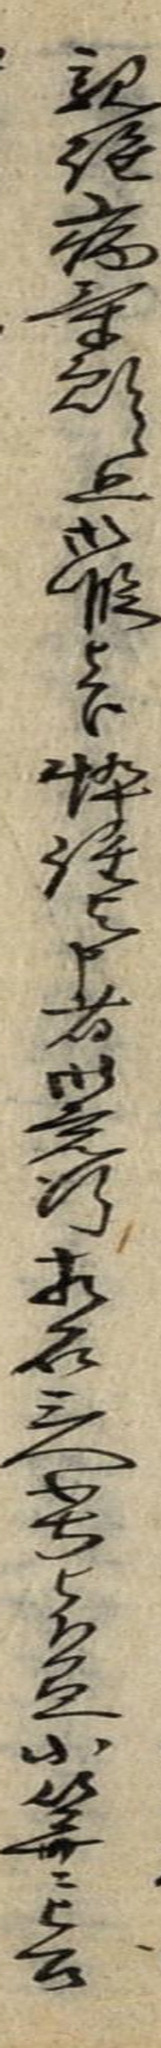親誰病気願之上御暇被下忰誰と申者御充行拾石三人ふち被下置小算に被召
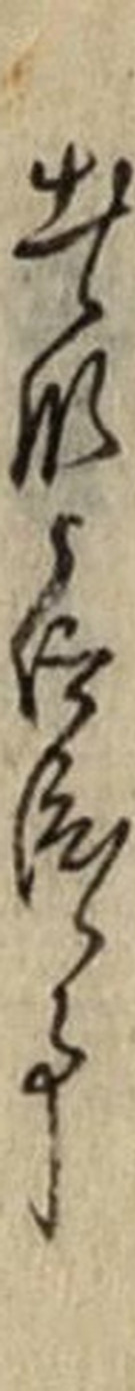出候段被仰渡候事
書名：御用并被仰出之部
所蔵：福井県文書館 Fukui Prefectural Archives
